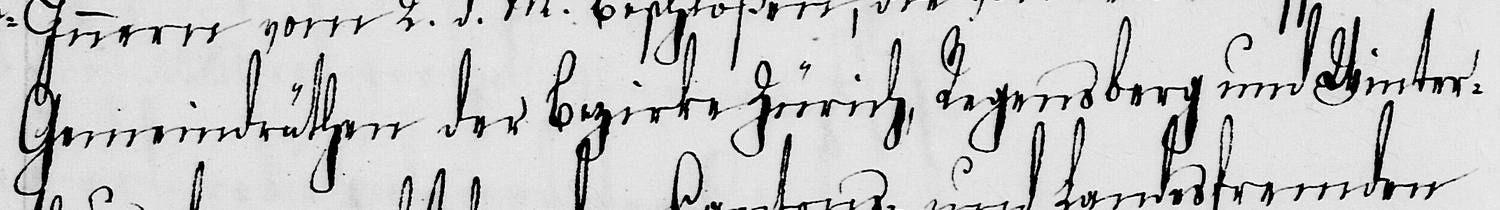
Gemeindräthen der Bezirke Zürich, Regensberg und Winter¬
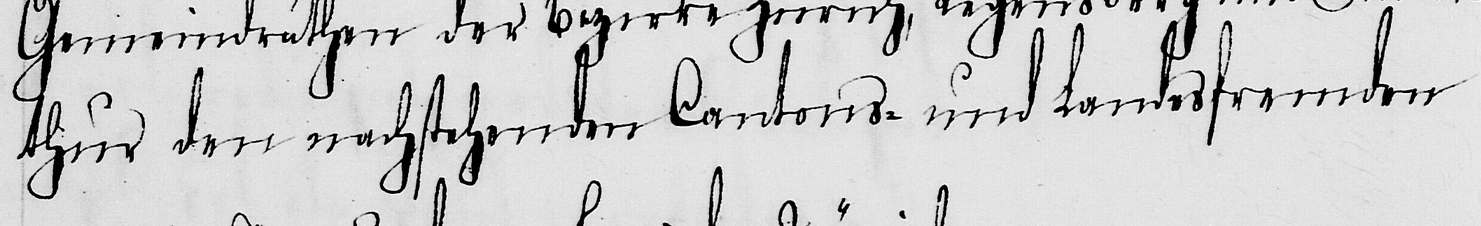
thur den nachstehenden Cantons- und Landesfremden
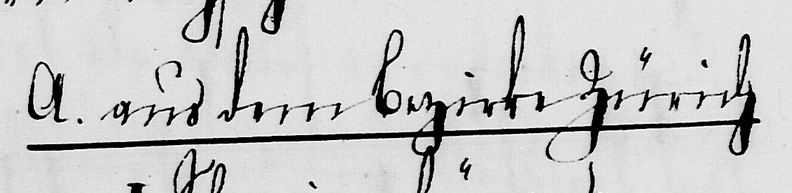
A. aus dem Bezirke Zürich
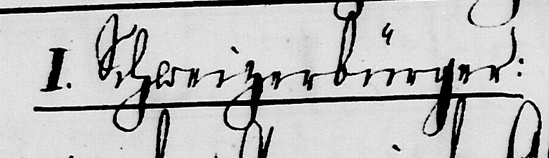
I. Schweizerbürger:
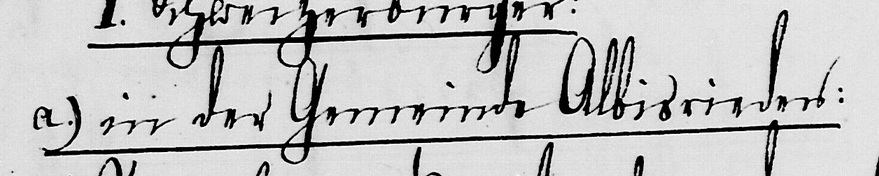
a.) in der Gemeinde Albisrieden:
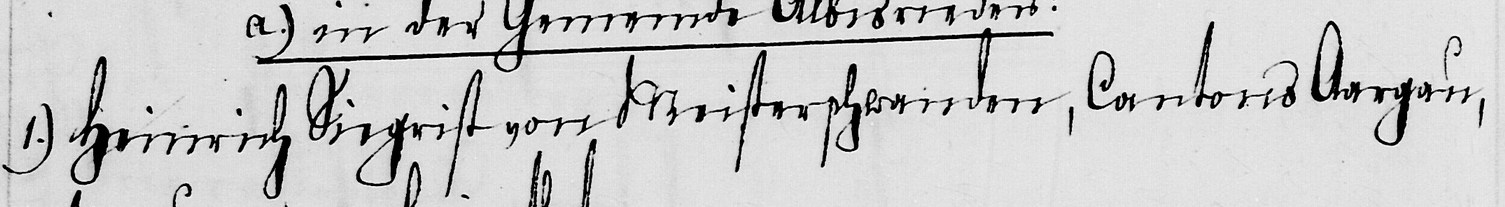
1.) Heinrich Sigrist von Meisterschwanden, Cantons Aargau,
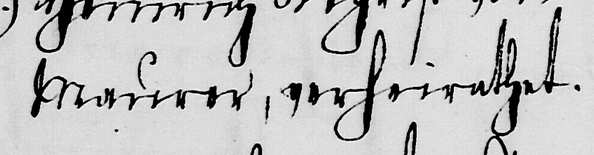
Maurer, verheirathet.
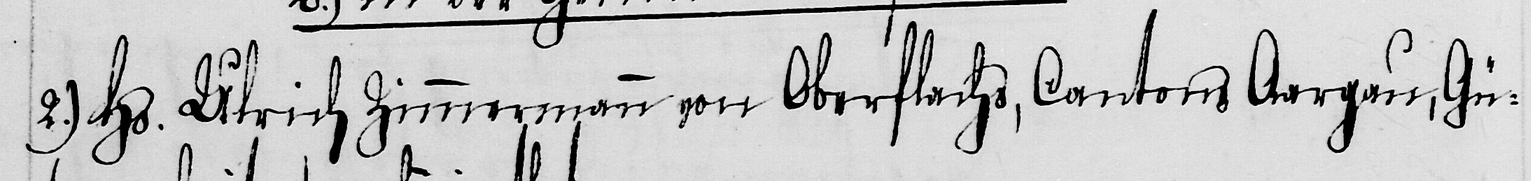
2.) Hs. Ulrich Zimmermann von Oberflachs, Cantons Aargau, Gü¬
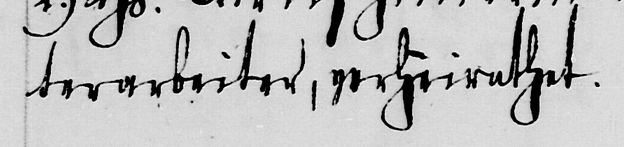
terarbeiter, verheirathet.
